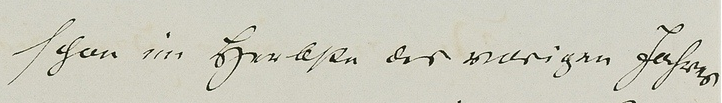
schon im Herbste des vorigen Jahres
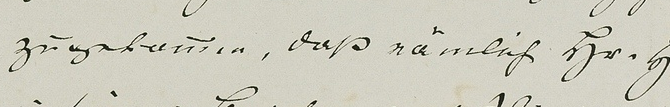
zugekommen, daß nämlich Hr. H.
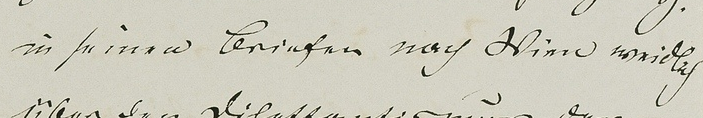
in seinen Briefen nach Wien weidlich
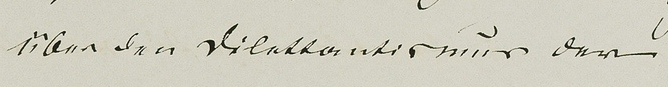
über den Dilettantismus der
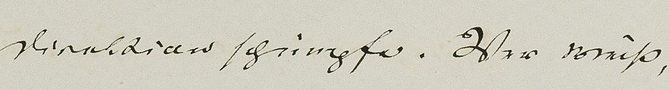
Direktion schimpfe. Wer weiß,
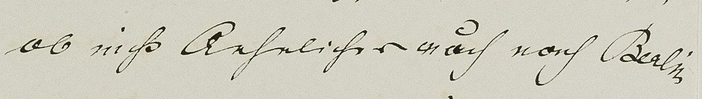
ob nicht Aehnliches auch nach Berlin
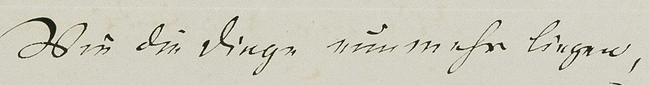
Wie die Dinge nunmehr liegen,
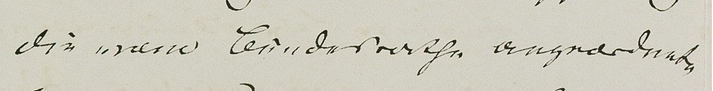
die vom Bundesrathe angeordnete
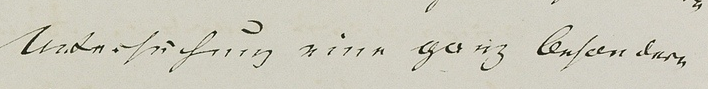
Untersuchung eine ganz besondere
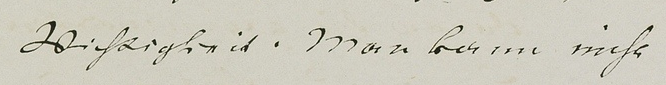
Wichtigkeit. Man kann nicht
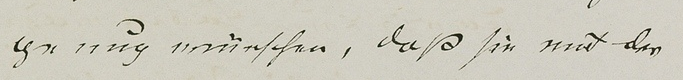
genug wünschen, daß sie mit der
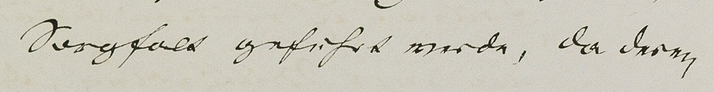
Sorgfalt geführt werde, da deren
